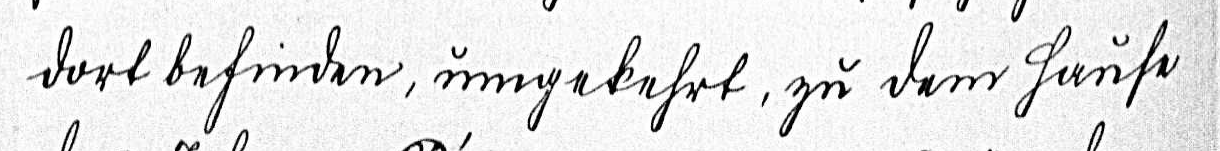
dort befinden, umgekehrt, zu dem Hause
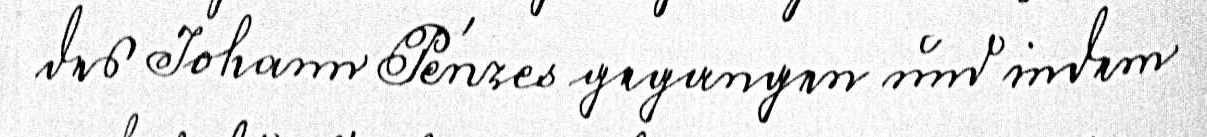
des Johann Pénzes gegangen und indem
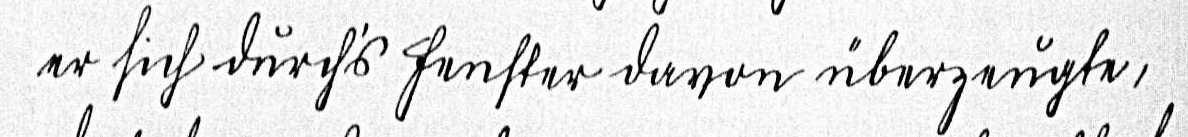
er sich durch’s Fenster davon überzeugte,
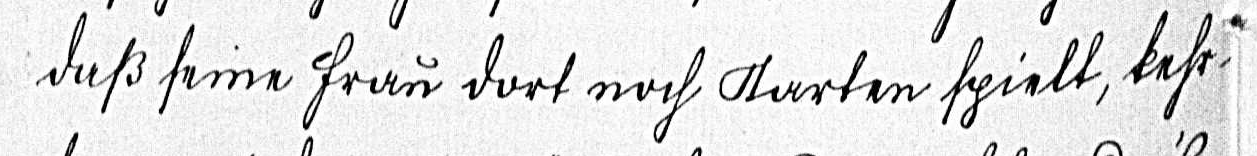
daß seine Frau dort noch Karten spielt, kehr¬
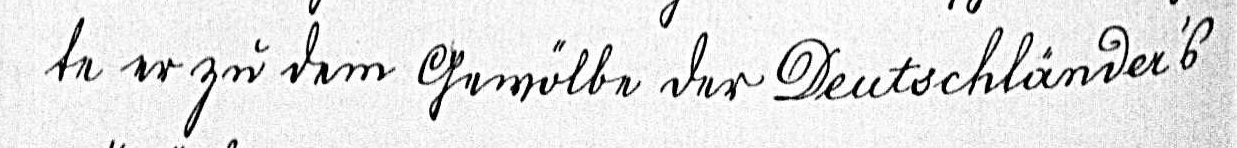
te er zu dem Gewölbe der Deutschländer’s
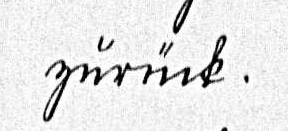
zurück.
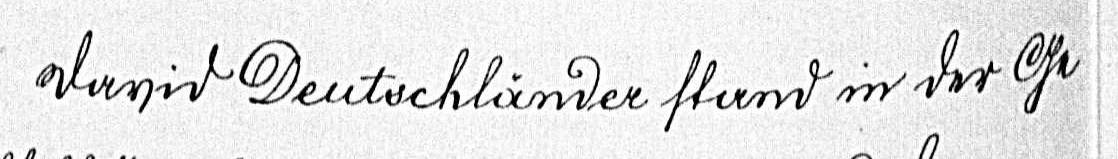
David Deutschländer stand in der Ge¬
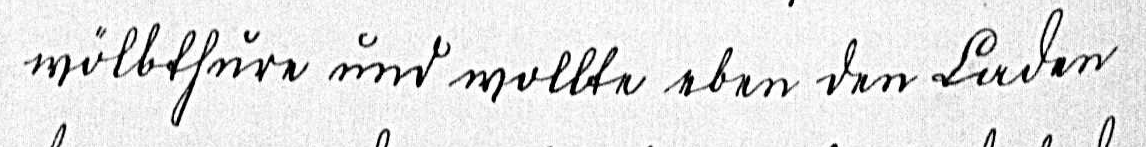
wölbthure und wollte eben den Laden
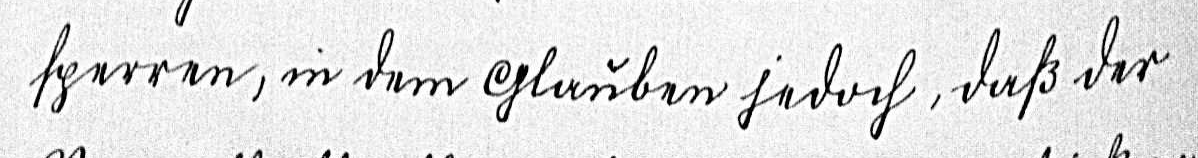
sperren, in dem Glauben jedoch, das der
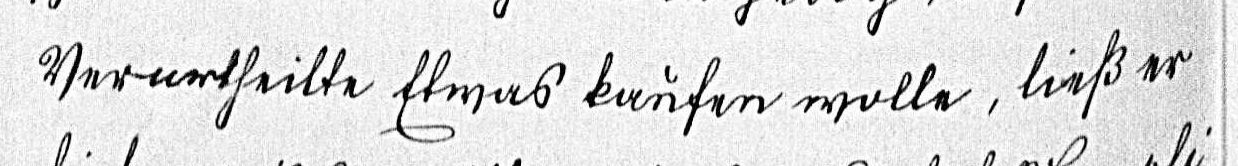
Verurtheilte Etwas kaufen wolle, ließ er
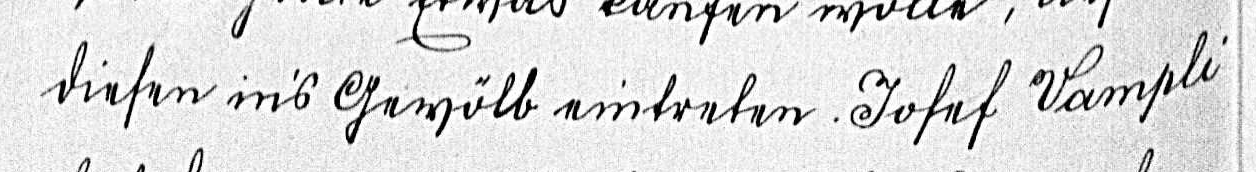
diesen in’s Gewölb eintreten. Josef Vampli
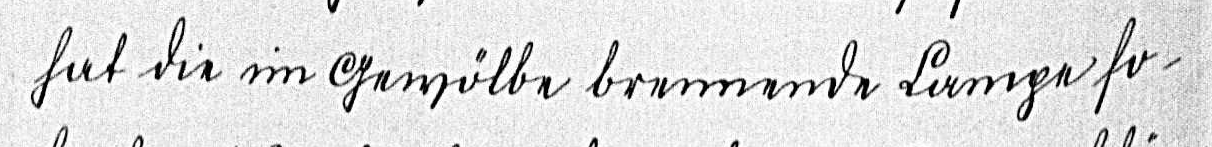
hat die im Gewölbe brennende Lampe so¬
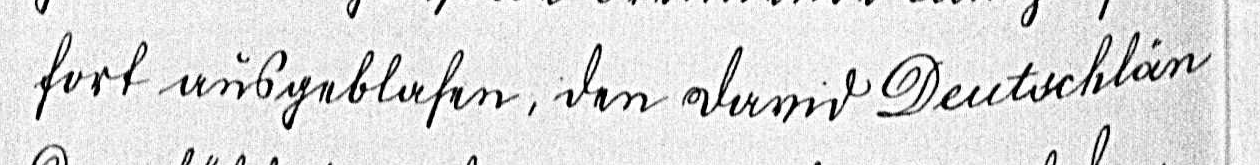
fort ausgeblasen, den David Deutschlän¬
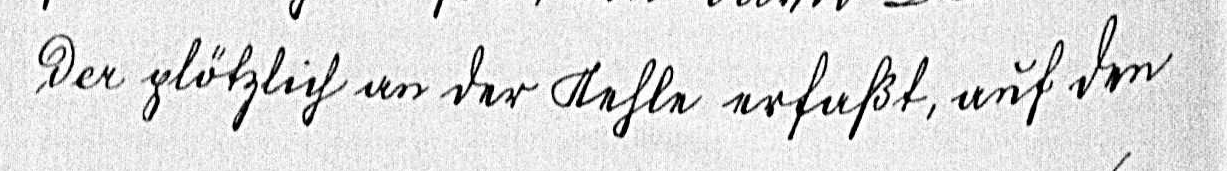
der plötzlich an der Kehle erfaßt, auf den
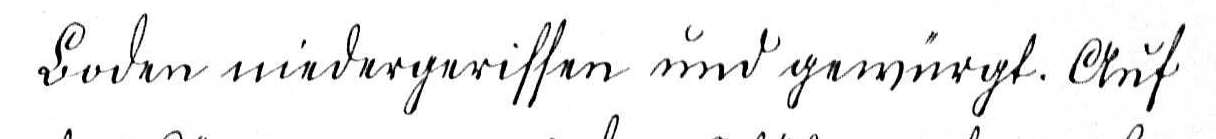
Boden niedergerissen und gewürgt. Auf
